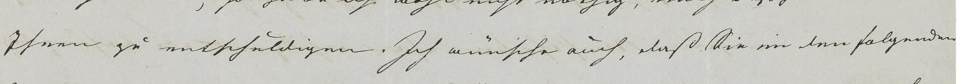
Ihnen zu entschuldigen. Ich wünsche auch, daß Sie in den folgenden
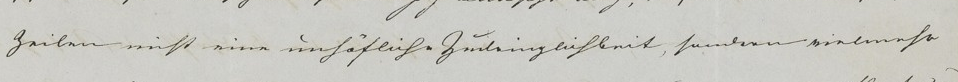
Zeilen nicht eine unhöfliche Zudringlichkeit, sondern vielmehr
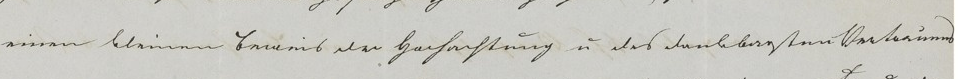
einen kleinen Beweis der Hochachtung u des dankbarsten Vertrauens
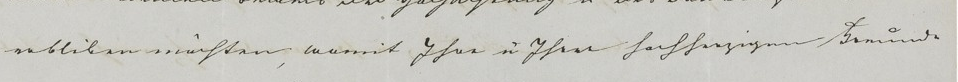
erbliken möchten, womit Ihre u Ihrer hochherzigen Freunde
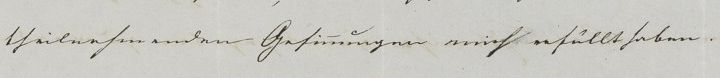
theilnehmenden Gesinnungen mich erfüllt haben.
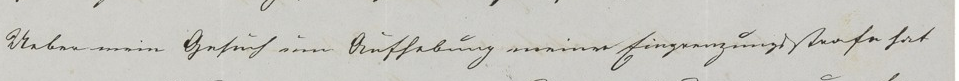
Ueber mein Gesuch um Aufhebung meiner Eingrenzungsstrafe hat
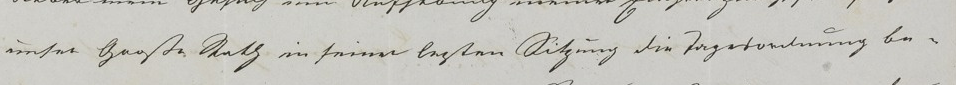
unser Große Rath in seiner lezten Sitzung die Tagesordnung be-
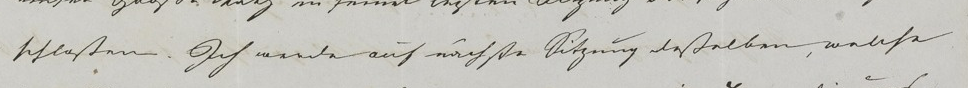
schloßen. Ich werde auf nächste Sitzung deßelben, welche
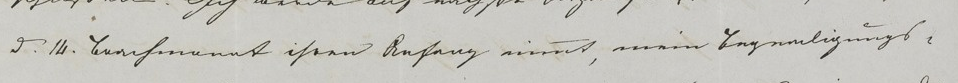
d. 14. Brachmonat ihren Anfang nimmt, mein Begnadigungs-
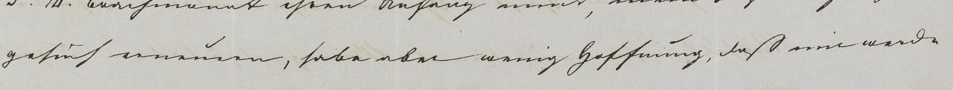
gesuch erneuern, habe aber wenig Hoffnung, daß mir werde
